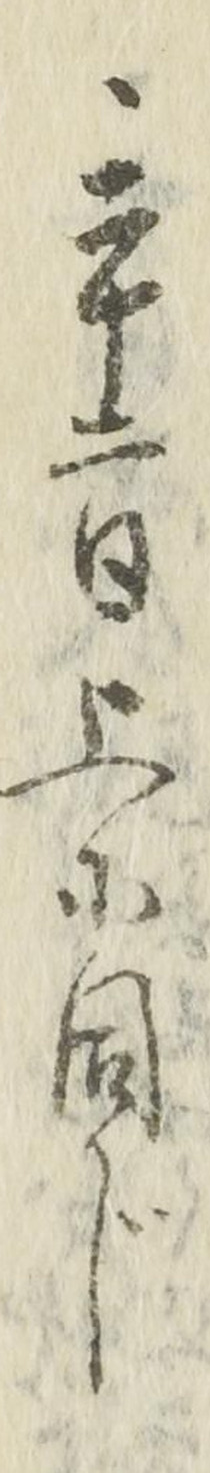、二十二日上に同じ
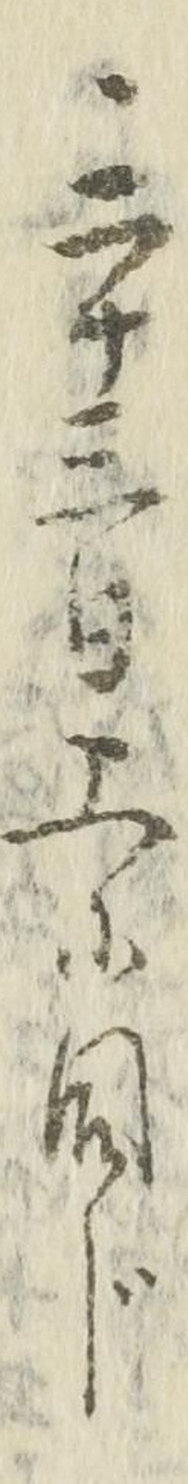、二十三日上に同じ
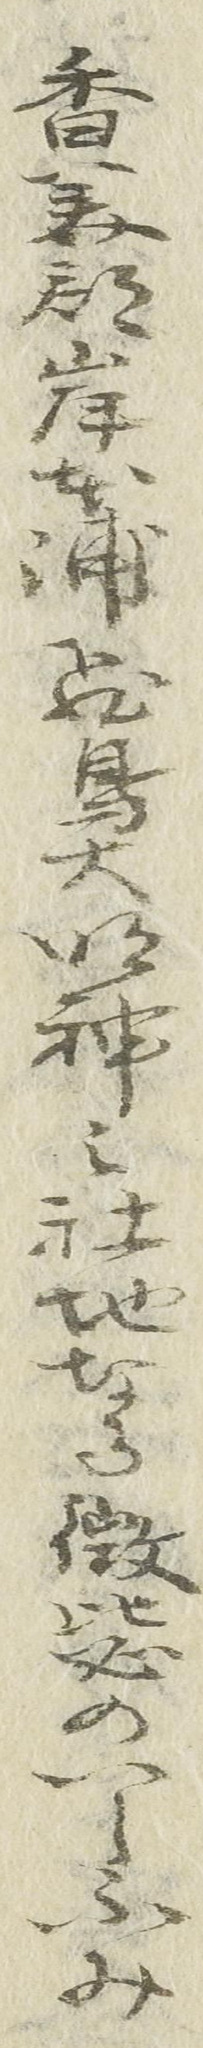香美郡岸本浦飛鳥大明神之社地なる徴毖のいしふみ
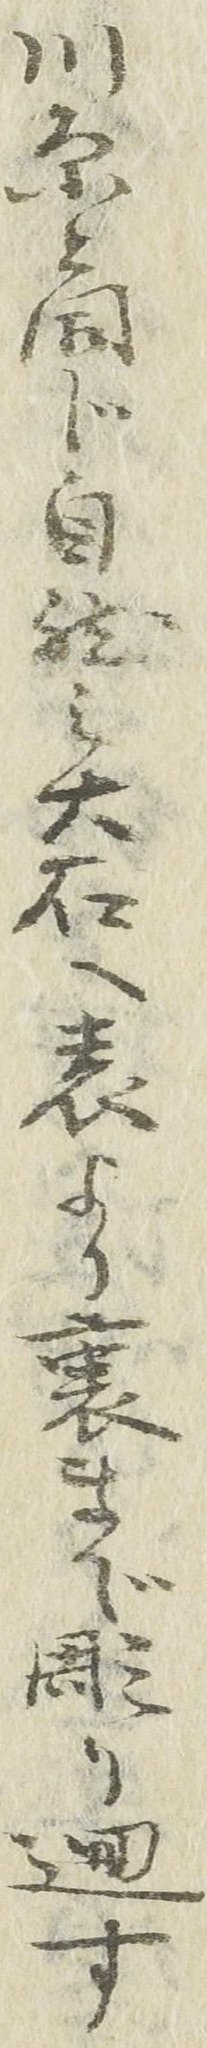川原と同じ自然之大石ヘ表より裏まで彫り廻す
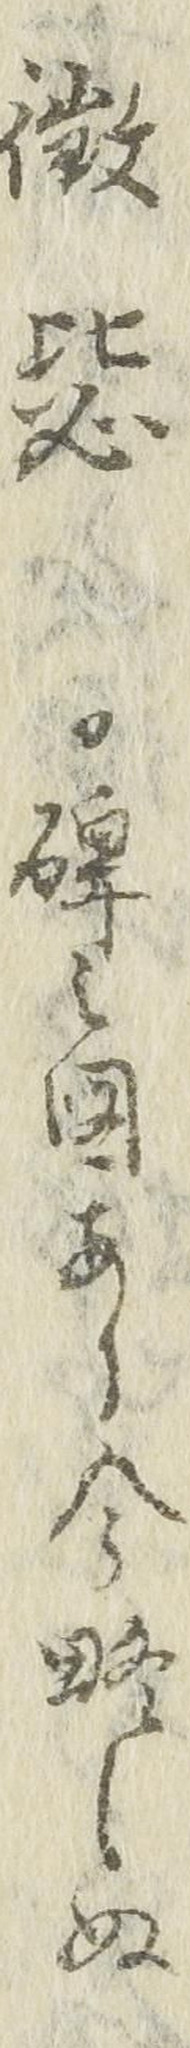徴毖〇碑之図あり今略しぬ
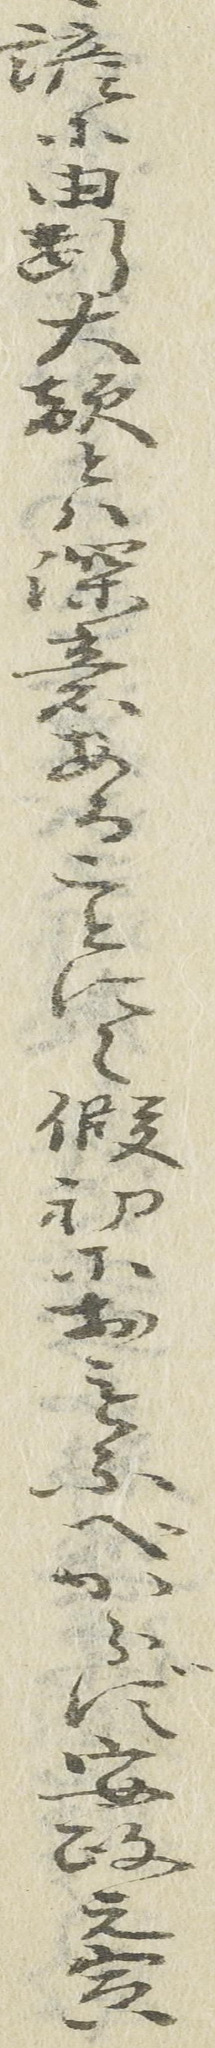、諺に由断大敵とハ深意あることにて仮初等おもふべからず安政元寅
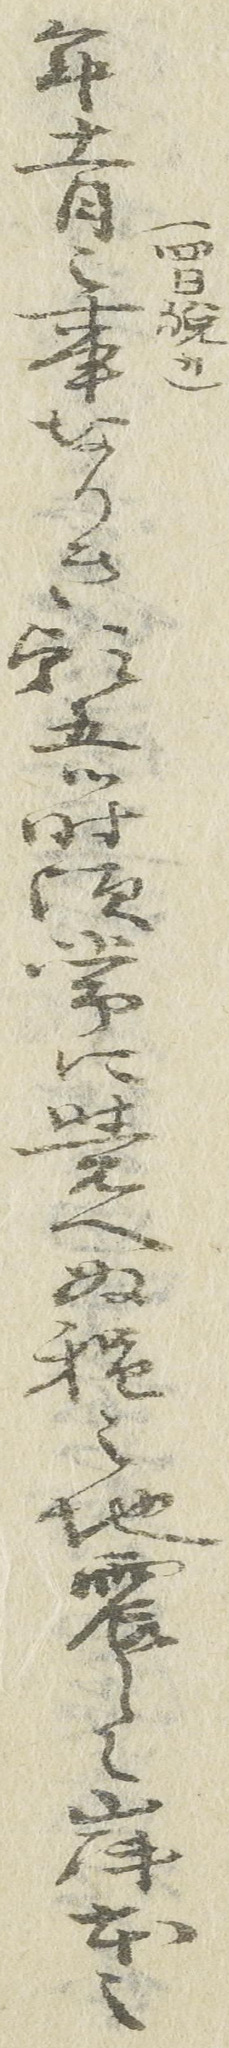年十一月之事なりき朝五ツ時頃常に覚へぬ程之地震して岸本之
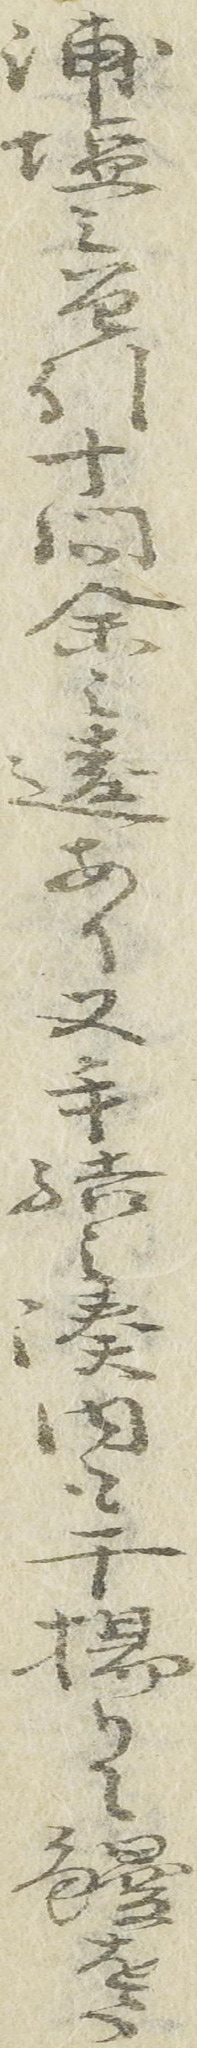浦塩之差引十間余之違あり又手結之湊内も干揚りて鰻をう
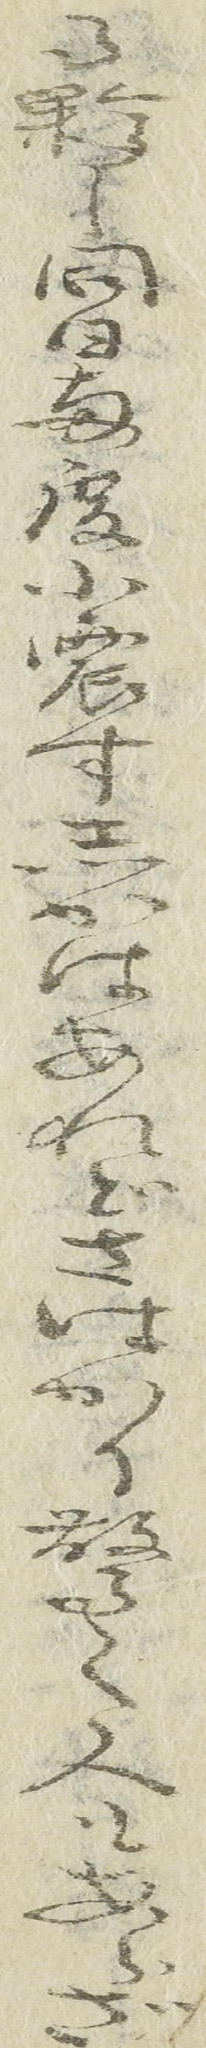る夥し同日両度小震スしかはあれどさはかり驚く人もあらざ
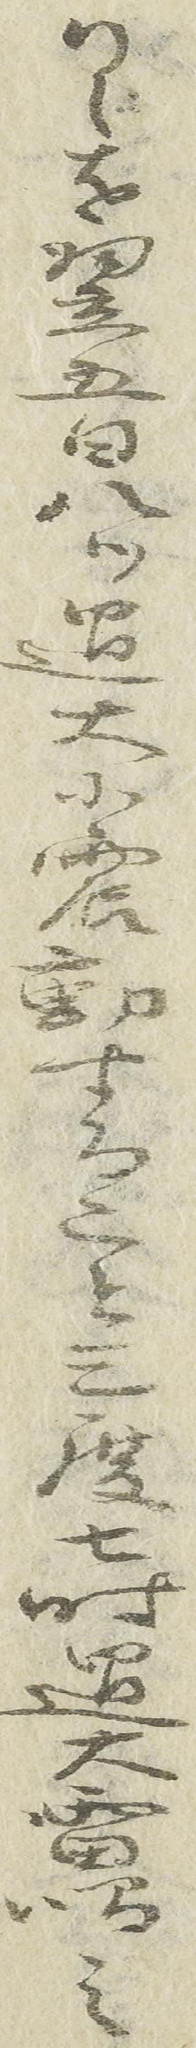りしを翌五日八ツ過大ニ震動すること三度七時過大雷鳴之

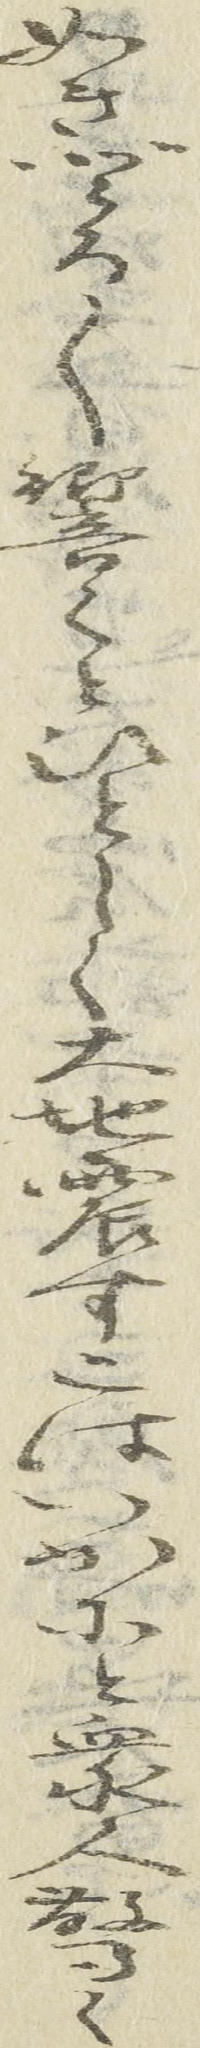如きどろ〳〵響くとひとしく大地震すこはいかにと衆人驚く
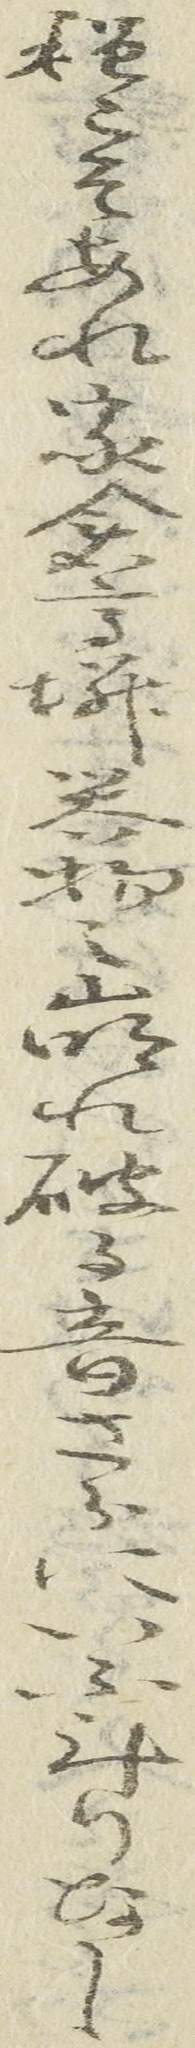程こそあれ家倉高塀器物之崩れ破る音さらにいふ計りなし
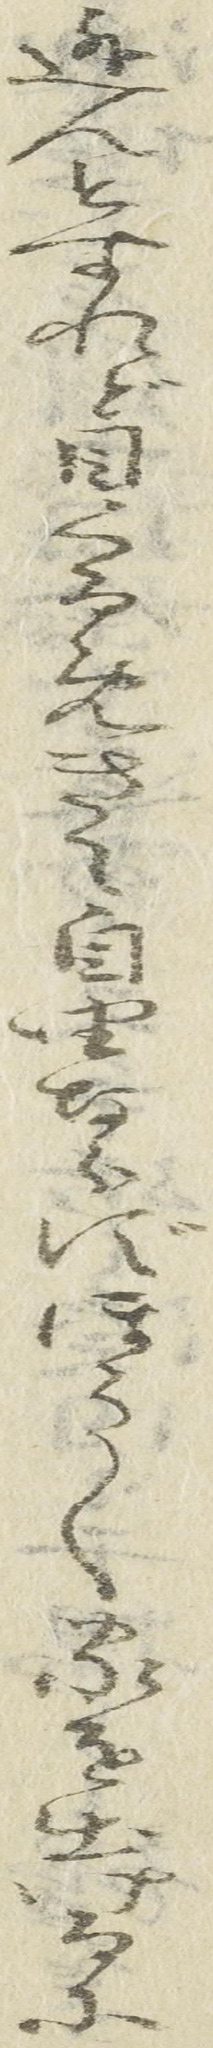逃んとすれど目くるめきて自由ならずほう〳〵家を出けるに
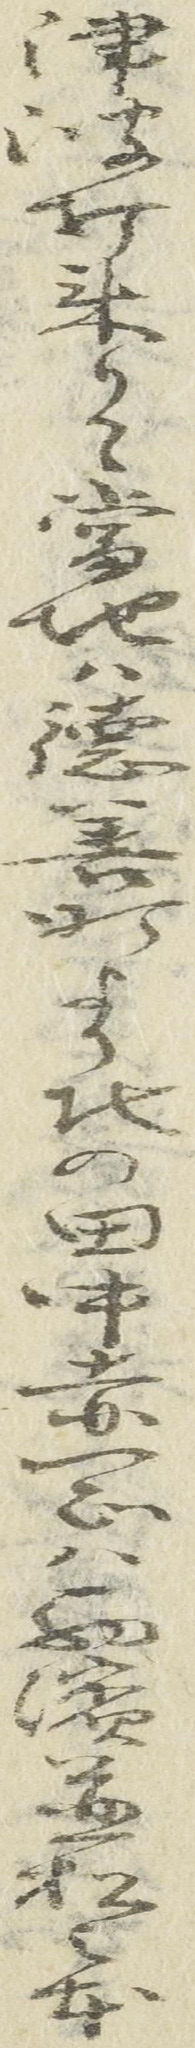津波打来りて当地ハ徳善町より北の田中赤岡ハ西濱並松之本
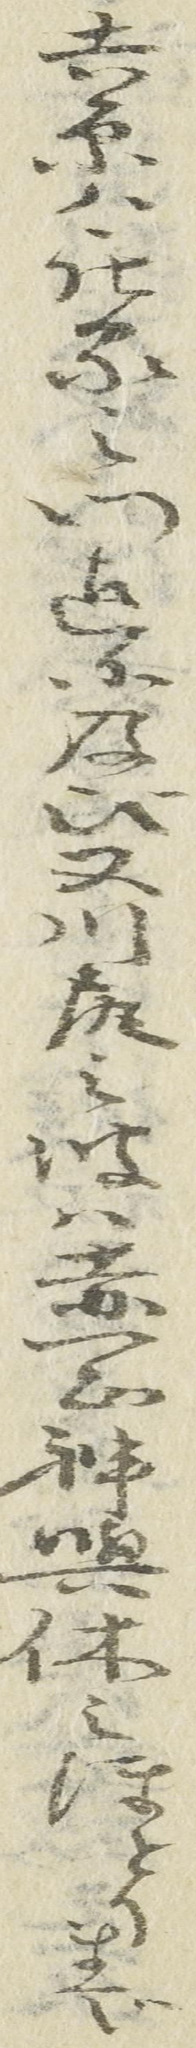吉原ハ庄家之門迠に及び又川尻之波ハ赤岡神輿休之ほとりまで
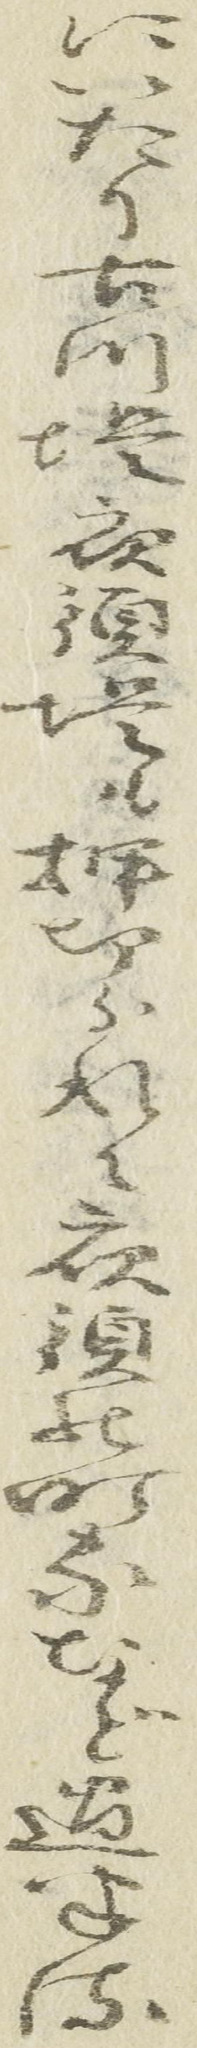にいたり古川堤夜須堤も押切られて夜須の町家など過半流
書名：地震前兆集　全
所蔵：東京大学地震研究所図書室 Earthquake Research Institute Library, The University of Tokyo, JAPAN
